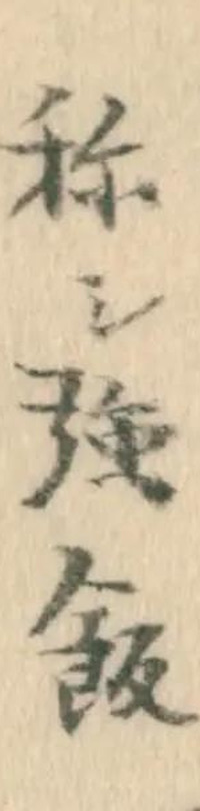称シ強飯

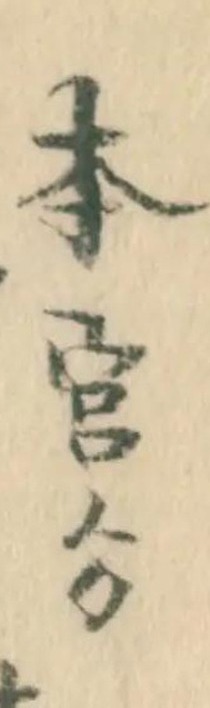本宮分
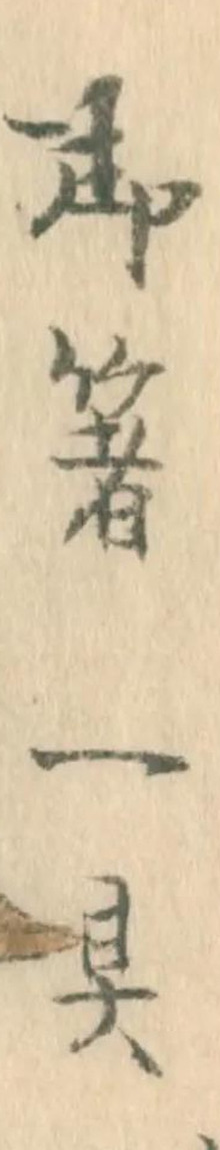御箸一具
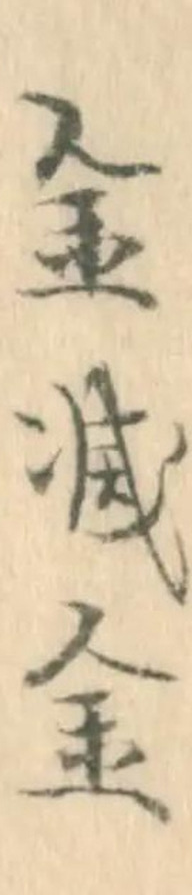金滅金
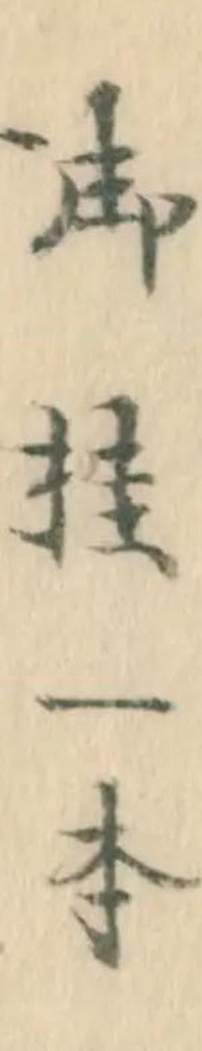御桂一本
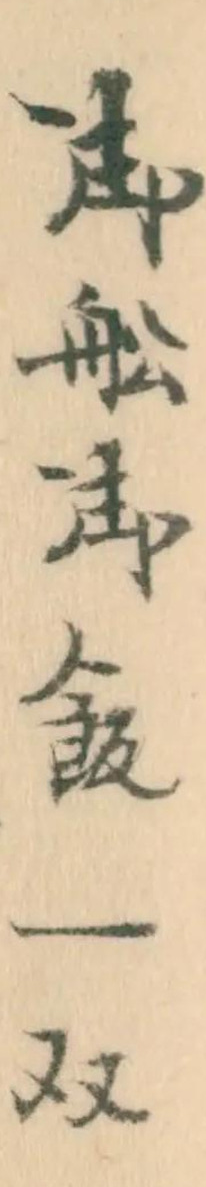御船御飯一双
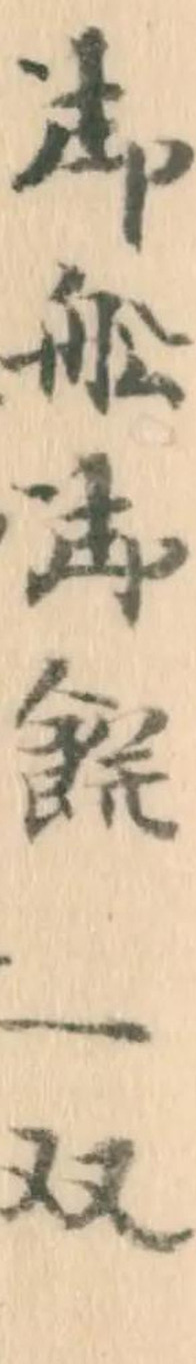御船御餅一双
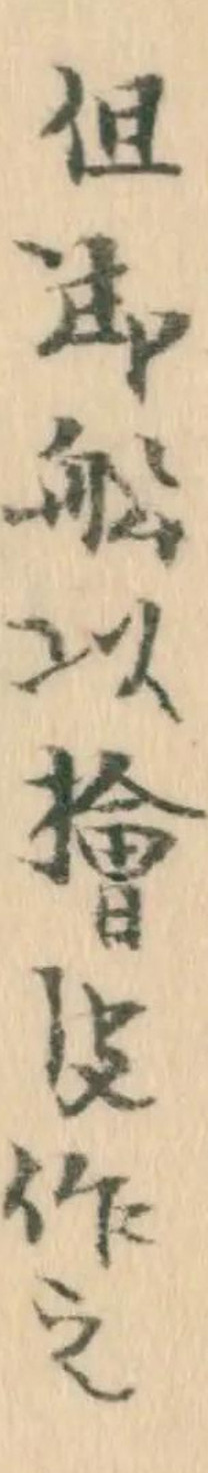但御船以檜皮作之
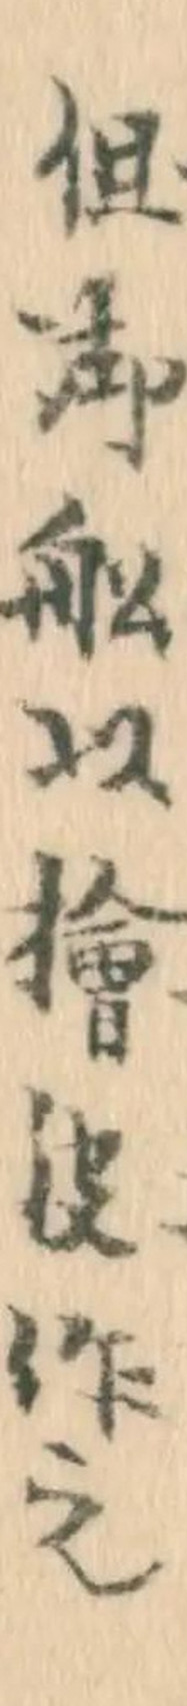但御船以檜皮作之
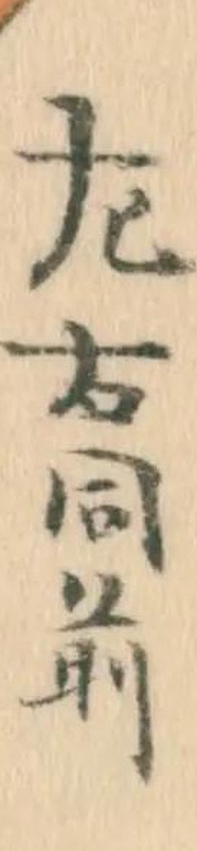左右同前
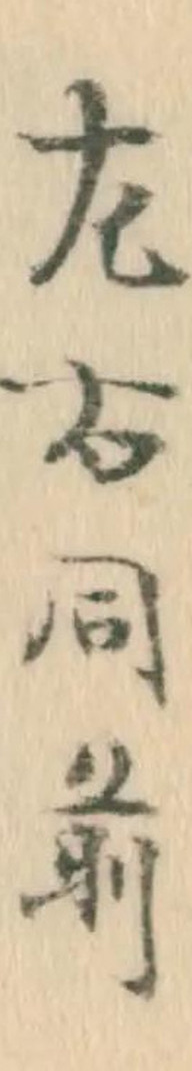左右同前
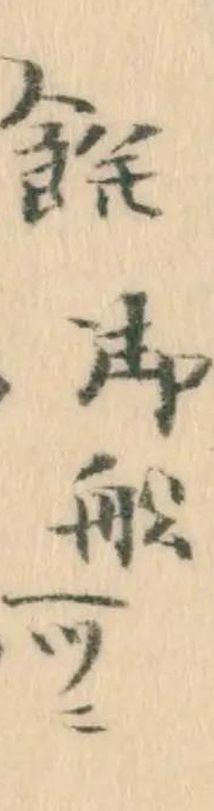餅御船一ッニ
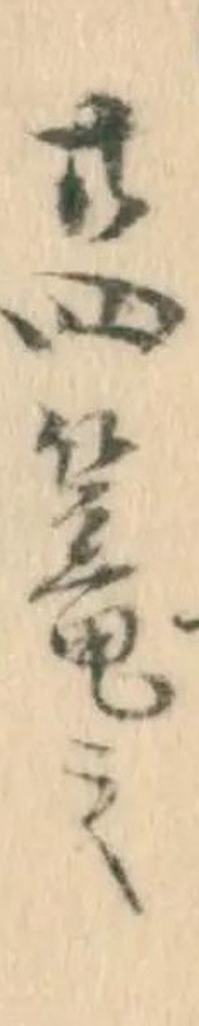廿四篭之
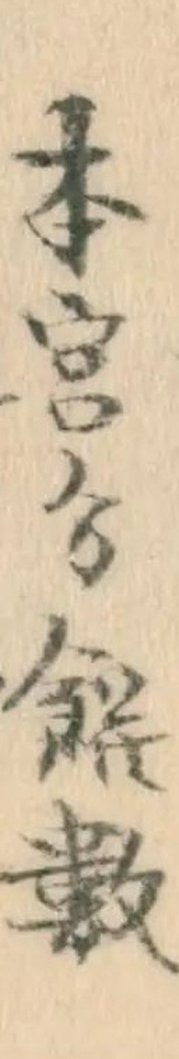本宮分餅数
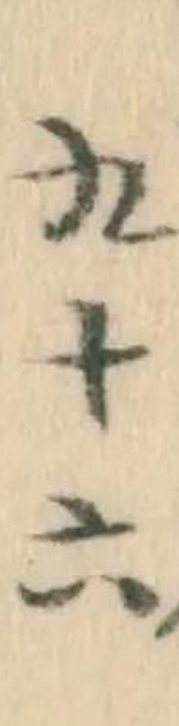九十六

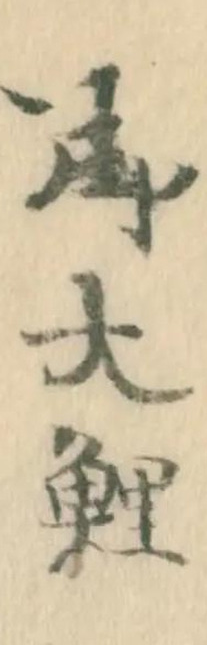御大鯉
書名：葵御祭供進之神饌諸品色目書
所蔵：国立国会図書館 National Diet Library, JAPAN
